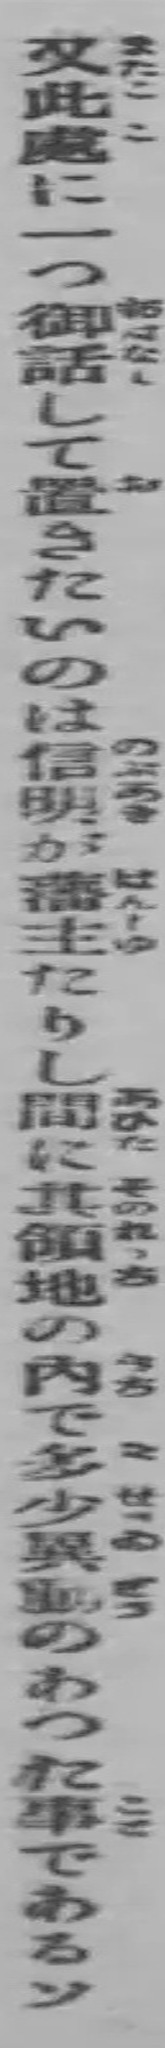領地の異動又此処に一つ御話して置きたいのは信明が藩主たりし間に其領地の内で多少異動のあつた事であるソ
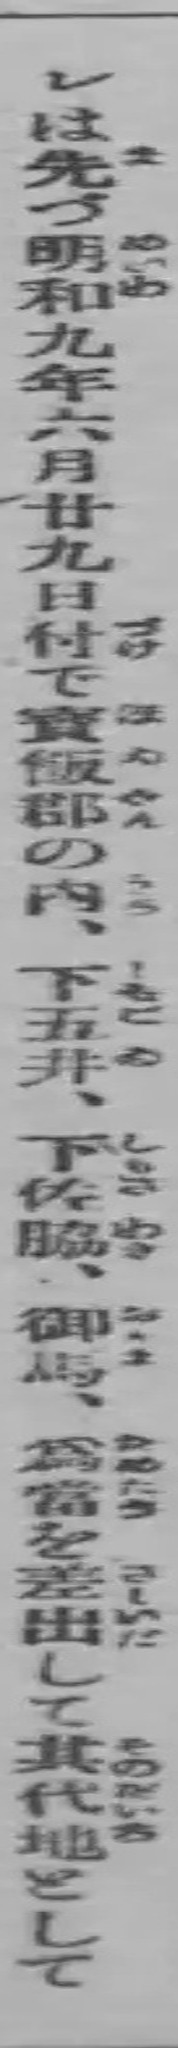レは先づ明和九年六月廿九日付で宝飯郡の内、下五井、下佐脇、御馬、為当を差出して其代地として
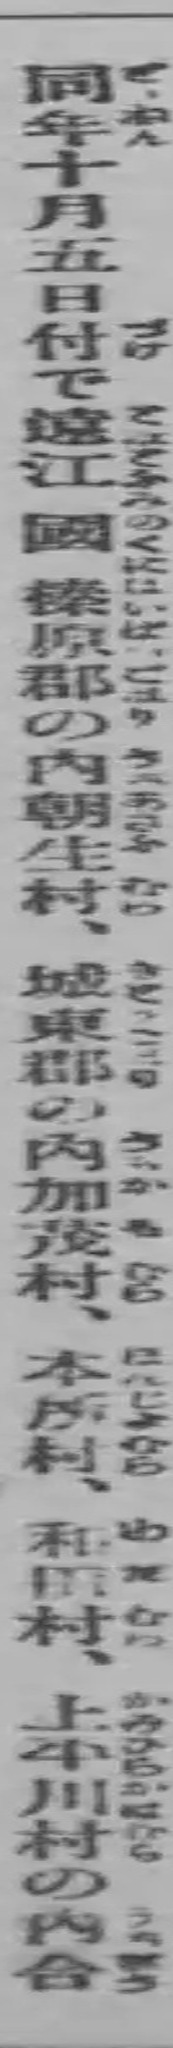同年十月五日付で遠江国榛原郡の内朝生村、城東郡の内加茂村、本所村、和田村、上平川村の内合
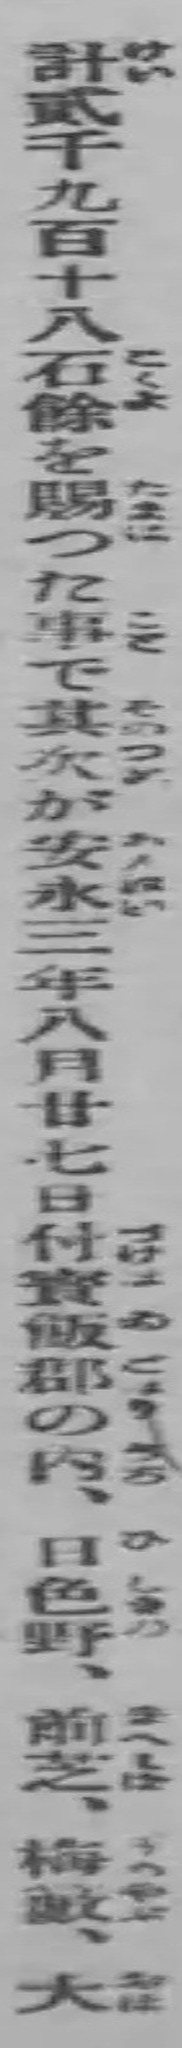計弐千九百十八石余を賜つた事で其次が安永三年八月廿七日付宝飯郡の内、日色野、前芝、梅薮、大
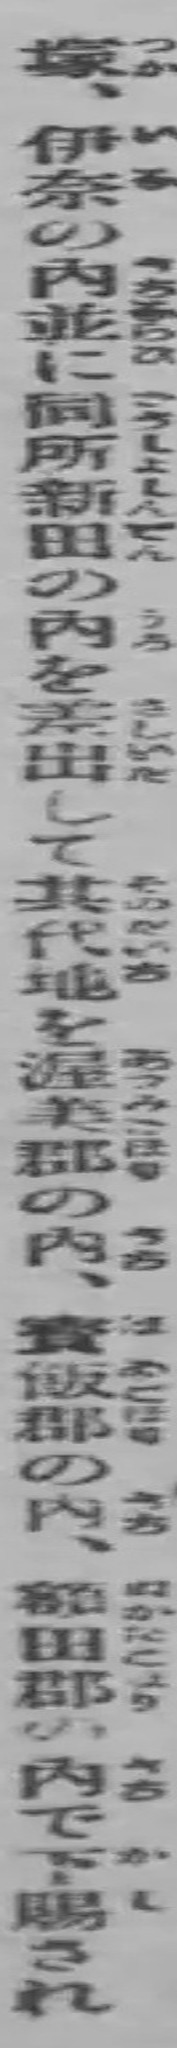塚、伊奈の内並に同所新田の内を差出して其代地を渥美郡の内、宝飯郡の内、額田郡の内で下賜され
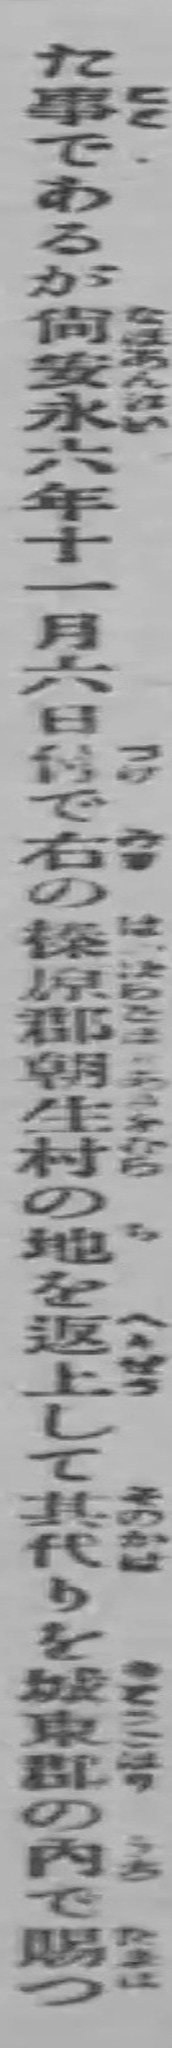た事であるが尚安永六年十一月六日付で右の榛原郡朝生村の地を返上して其代りを城東郡の内で賜つ
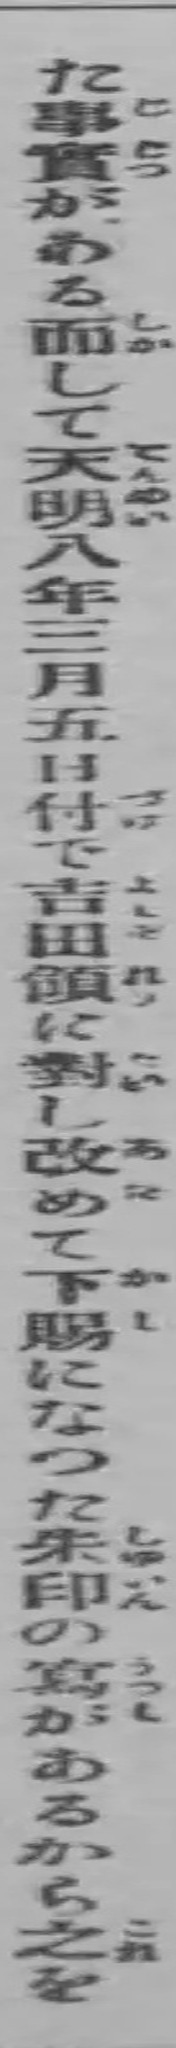た事実がある而して天明八年三月五日付で吉田領に対し改めて下賜になつた朱印の写があるから之を
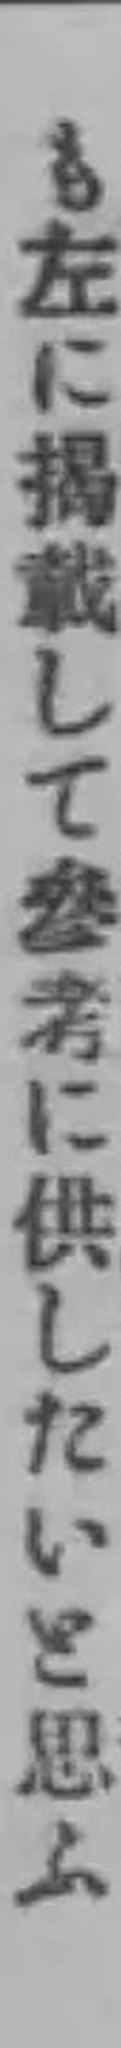も左に掲載して参考に供したいと思ふ
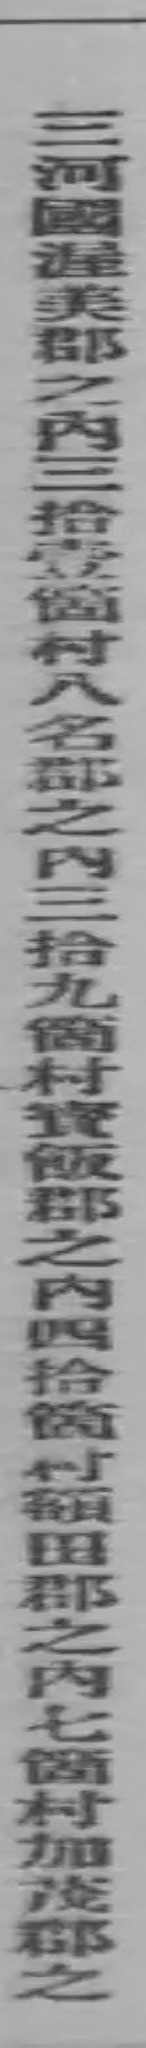三河国渥美郡之内三拾壱箇村八名郡之内三拾九箇村宝飯郡之内四拾箇村額田郡之内七箇村加茂郡之

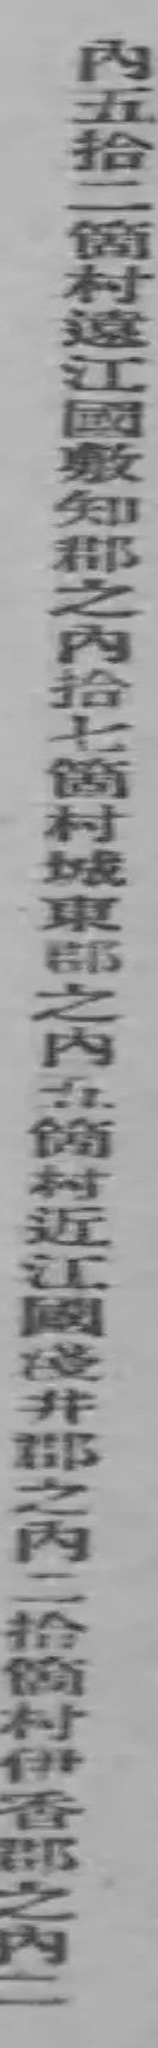内五拾二箇村遠江国敷知郡之内拾七箇村城東郡之内五箇村近江国浅井郡之内二拾箇村伊香郡之内二
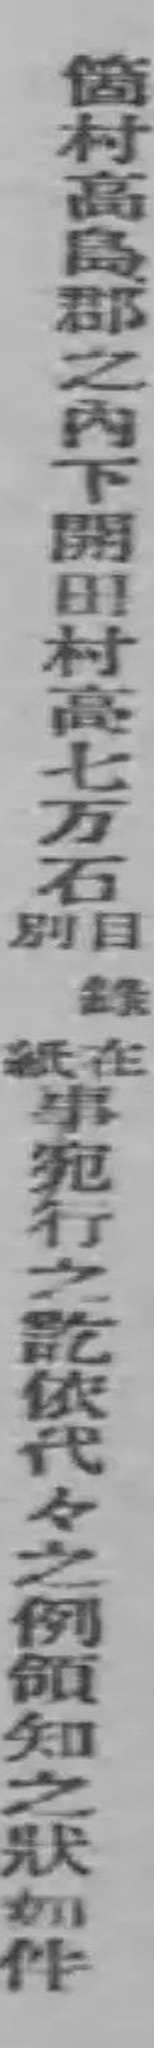箇村高島郡之内下開田村高七万石目録在別紙事宛行之訖依代々之例領知之状如件
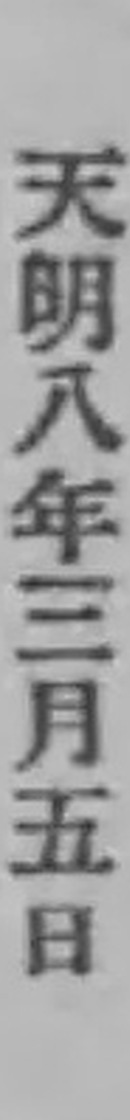天明八年三月五日
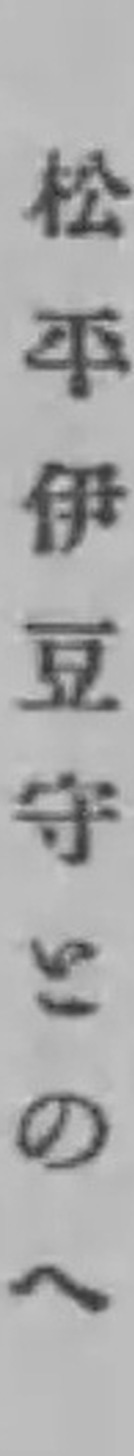松平伊豆守とのへ
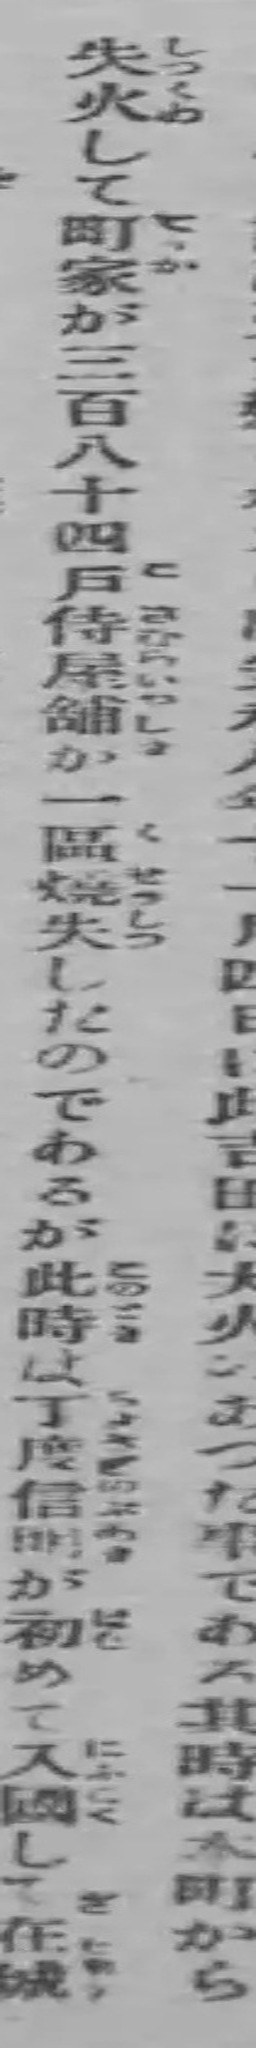失火して町家が三百八十四戸侍家舗が一区焼失したのであるが此時は丁度信明が初めて入国して在城
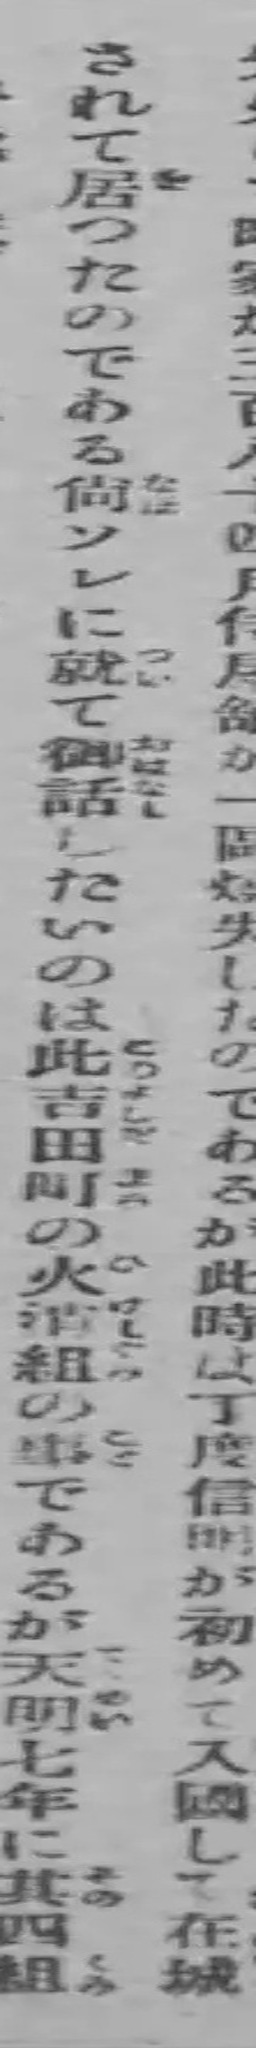火消組されて居つたのである尚ソレに就て御話したいのは此吉田町の火消組の事であるが天明七年に其四組
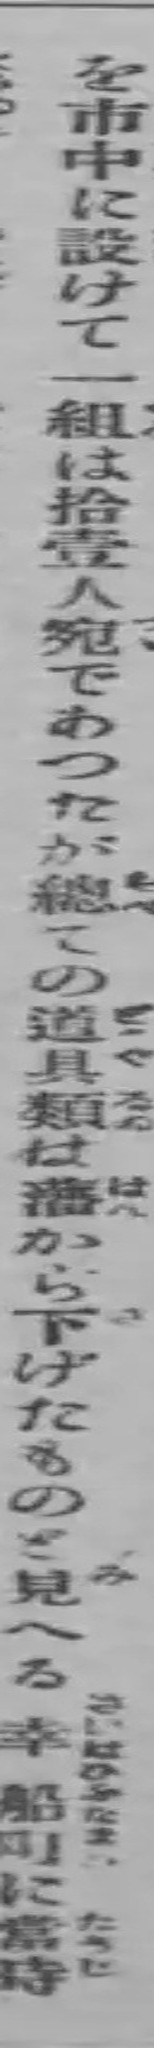を市中に設けて一組は拾壱人宛であつたが総ての道具類は藩から下げたものと見へる幸船町に当時
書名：豊橋市史談
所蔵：国立国会図書館 National Diet Library, JAPAN
